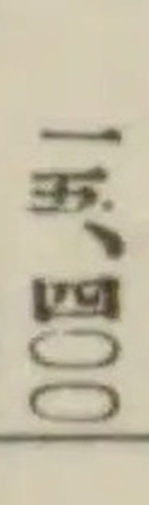雑費、四〇〇
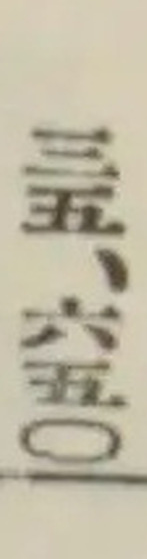計三五、六五〇
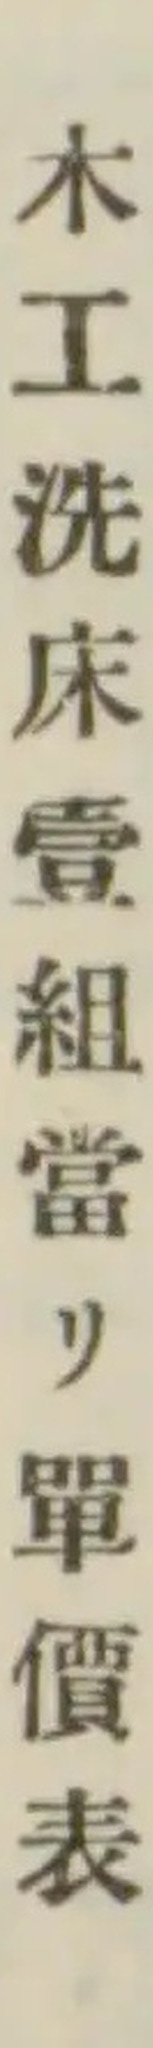木工洗床壹組当り単価表
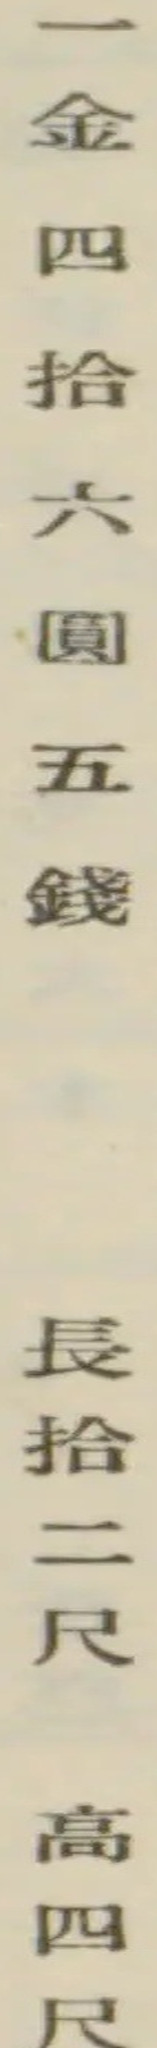一金四拾六圓五銭長拾二尺高四尺

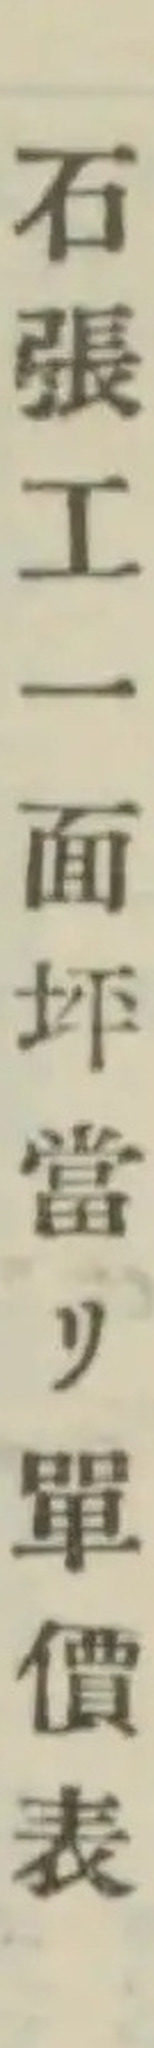石張工一面坪当り単価表
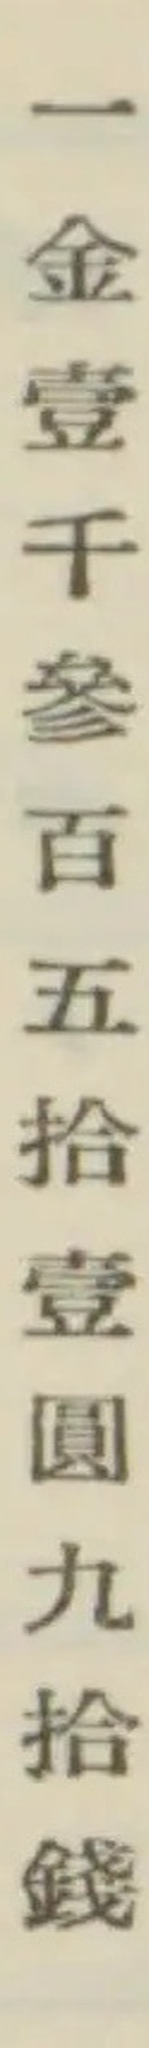一金壹千參百五拾壹圓九拾銭
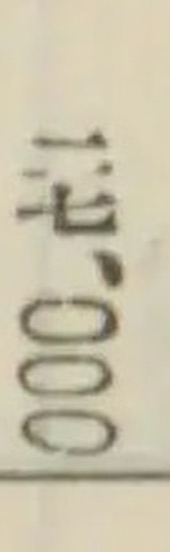計八、〇〇〇
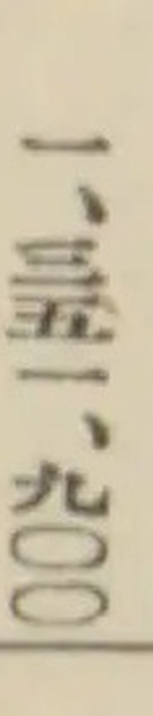計一、三五一、九〇〇

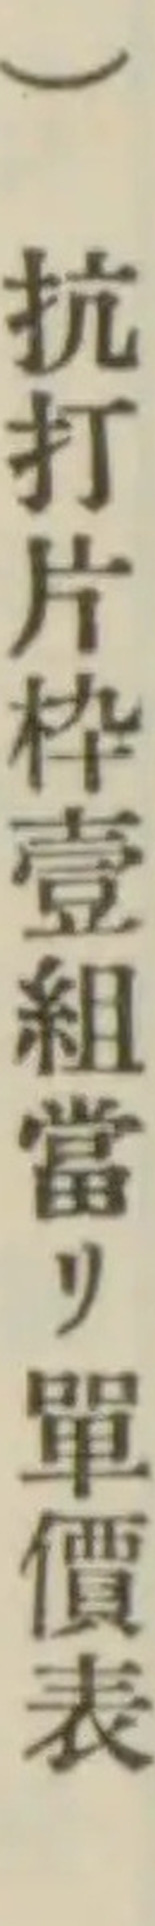(一)杭打片枠壹組当り単価表
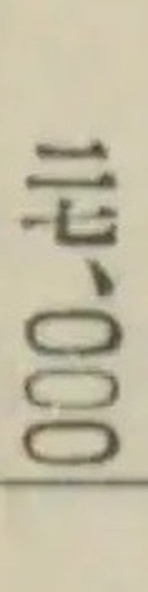計二七、〇〇〇
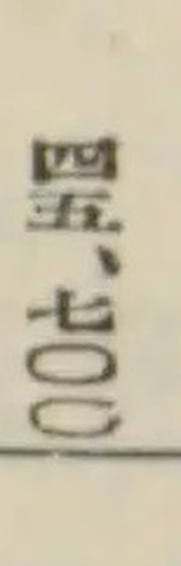計四五、七〇〇

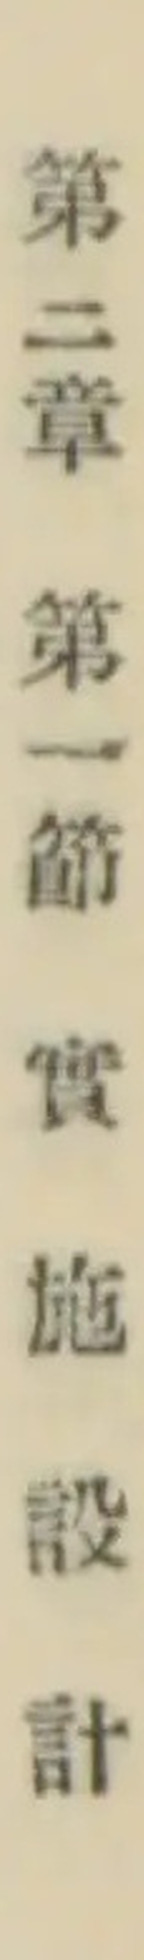第三章第一節実施設計
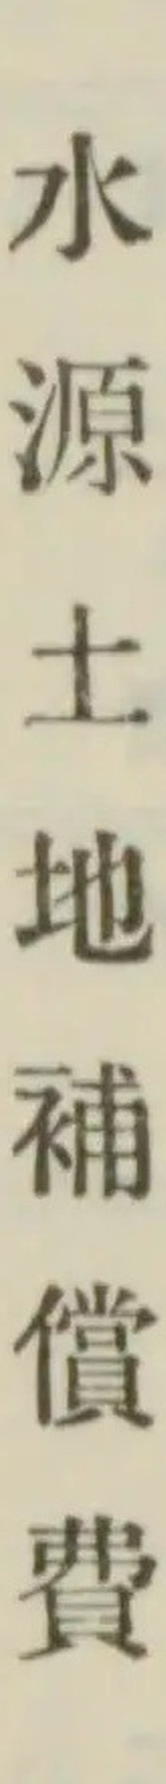水源土地補償費
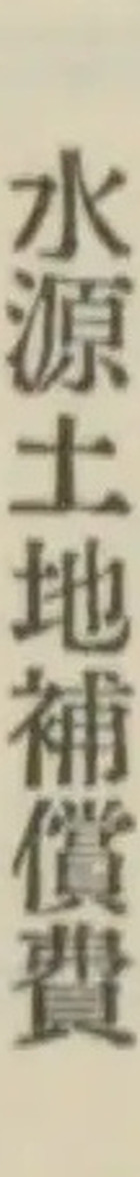水源土地補償費
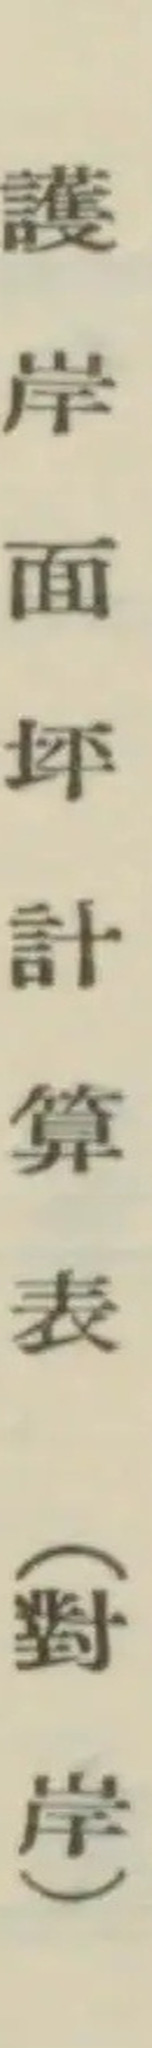護岸面坪計算表(対岸)
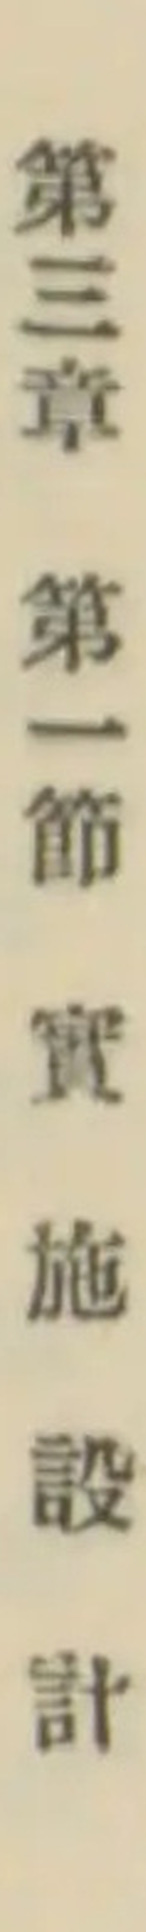第三章第一節実施設計
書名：豊橋市水道誌
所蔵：国立国会図書館 National Diet Library, JAPAN
